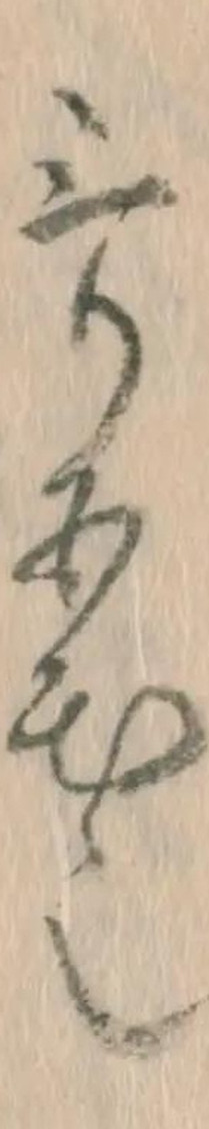三り五毛也

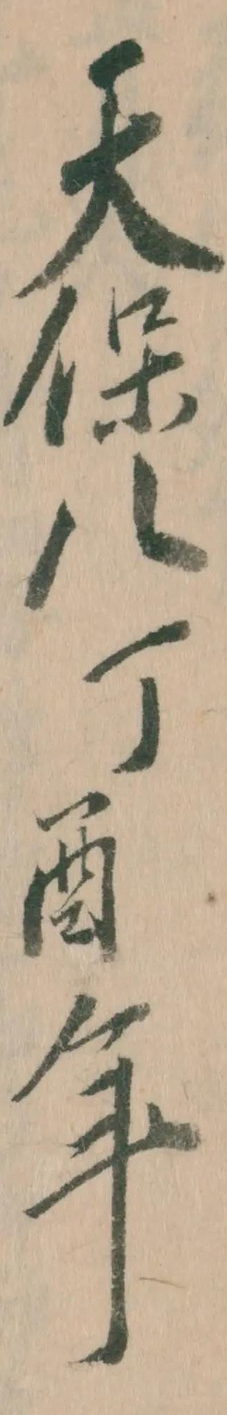天保八丁酉年
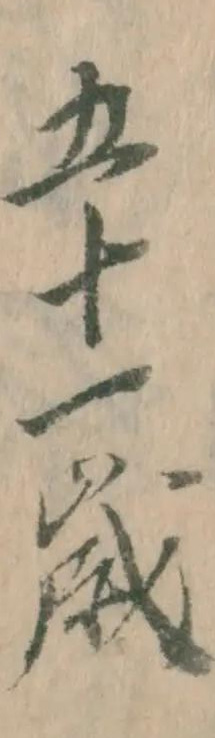五十一歳

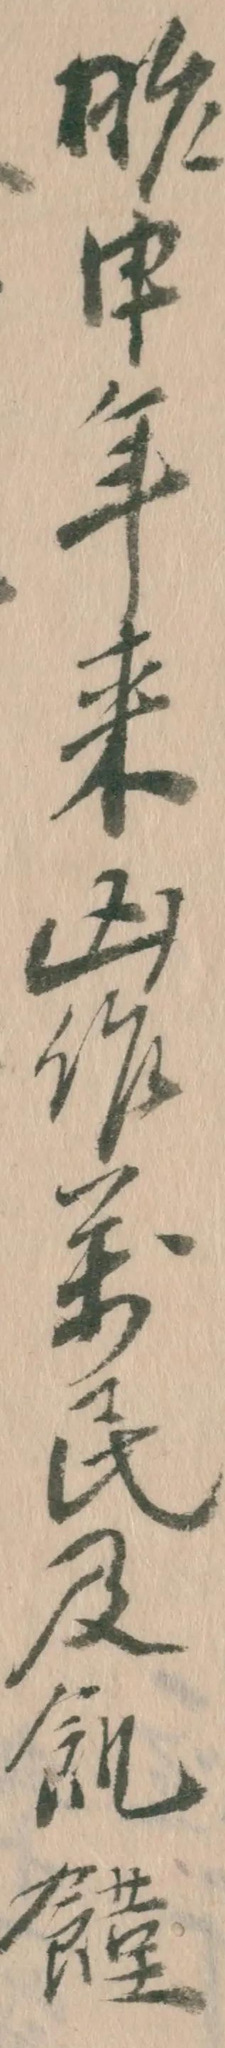昨申年来凶作萬民及飢饉
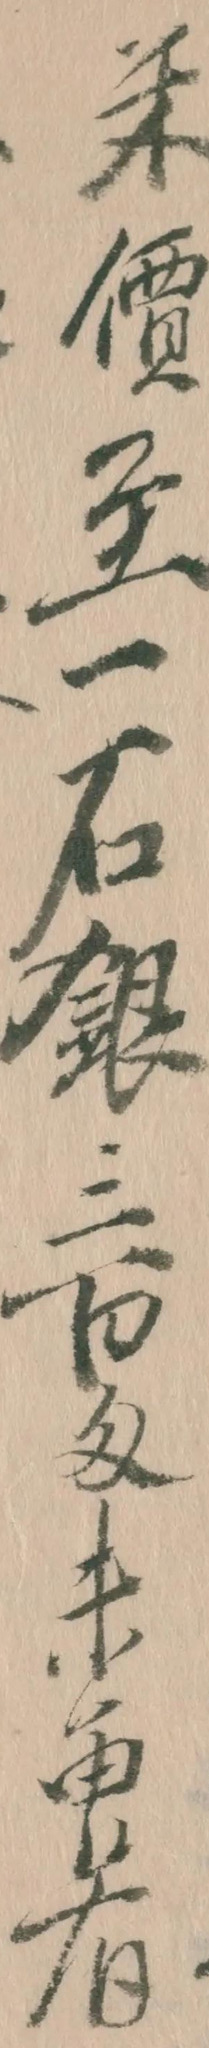米価至一石銀三百匁未曾有
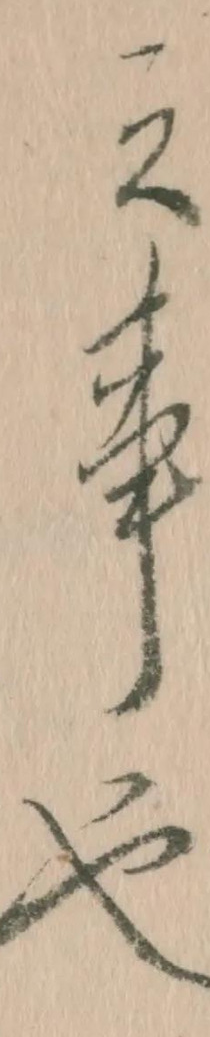之事也
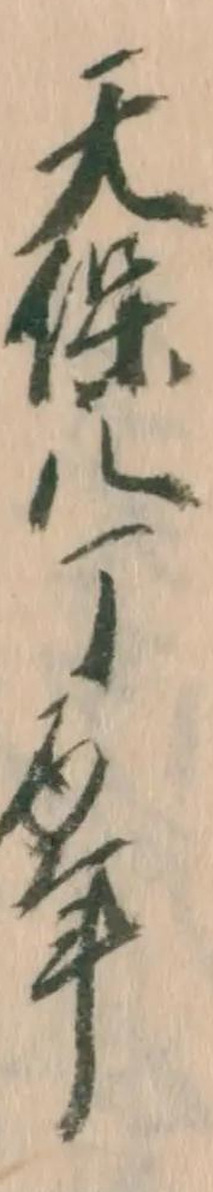天保八丁酉年
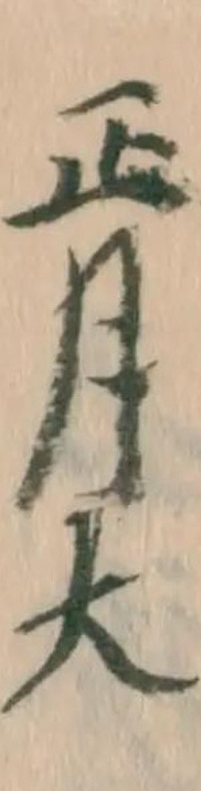正月大
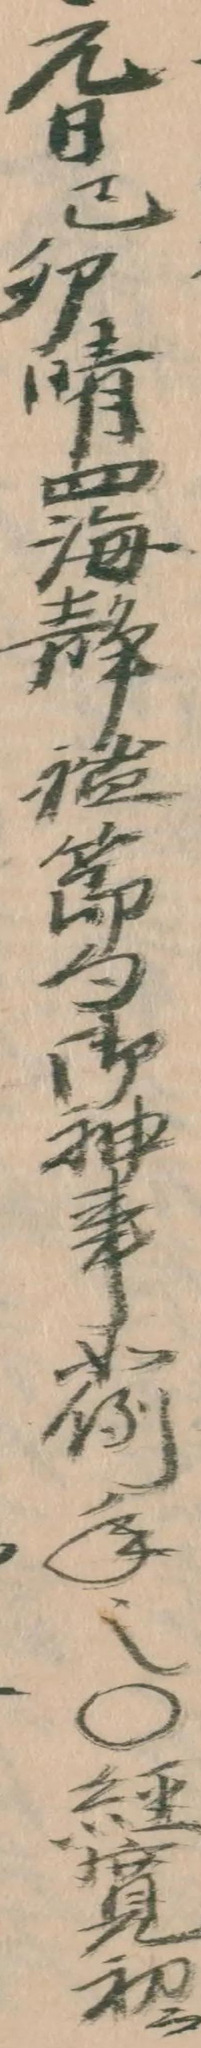元日己卯晴四海静謐節句御神事如例年也○経寛初而
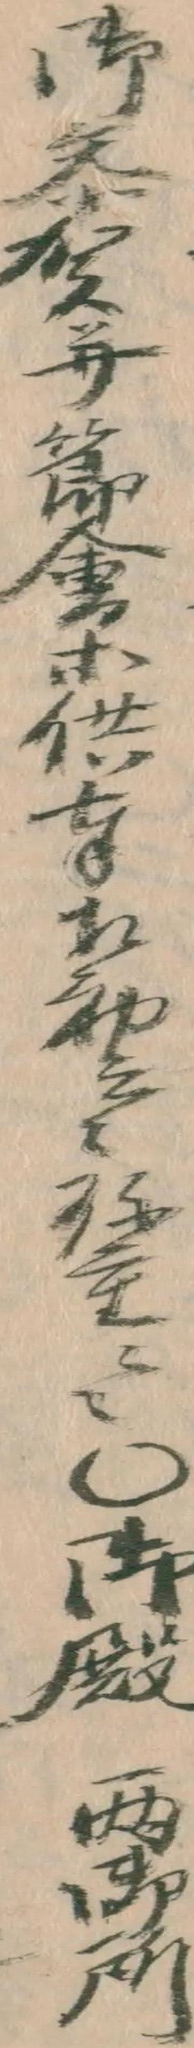御参賀並節會等供奉相勤云々珍重々々○御殿西御所
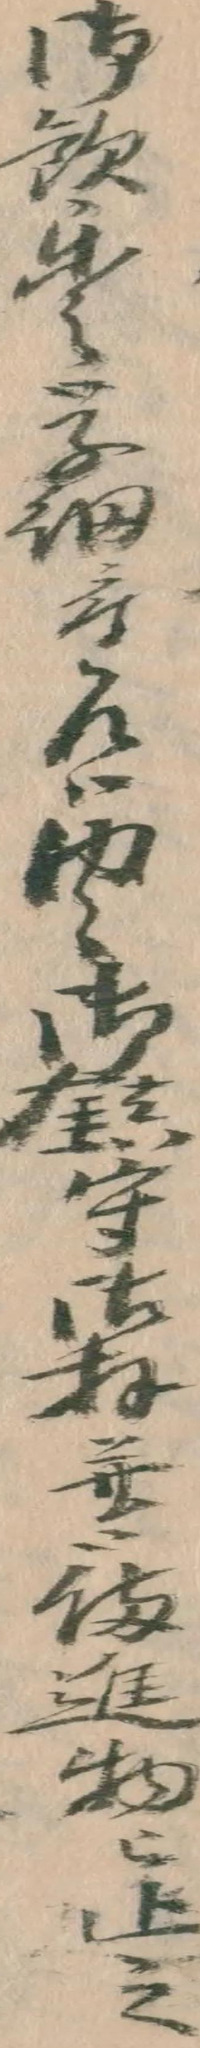御歓楽之御子細ニ付乍御内之御鎮守御拝並御備進物被止之
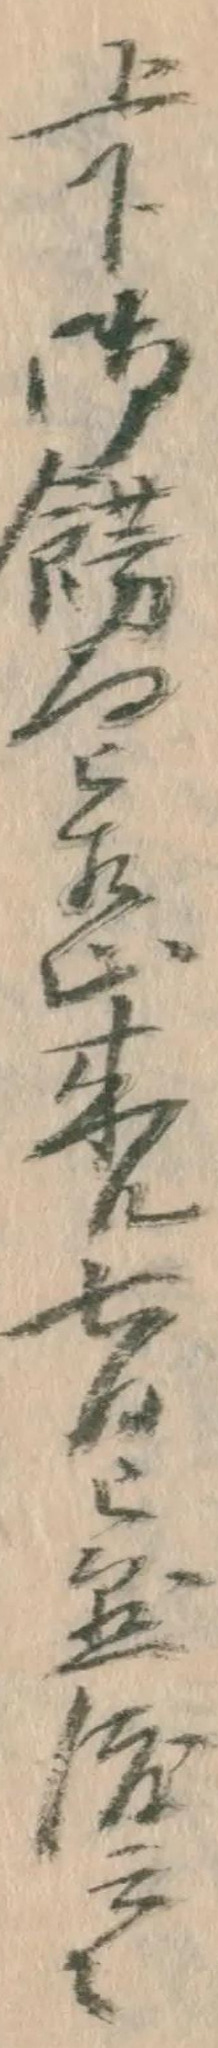上下御餝向被相正来ル七日被清云々
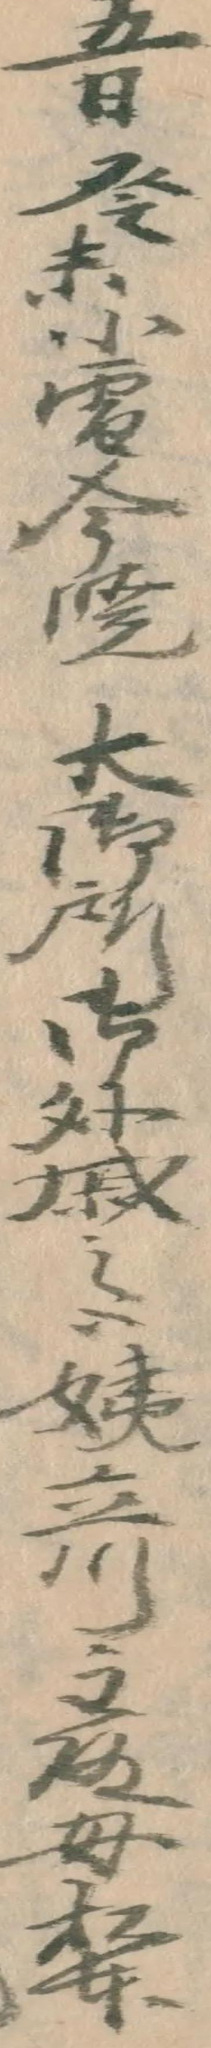五日癸未小雪今暁大御所御外戚御姨立川主殿母松本
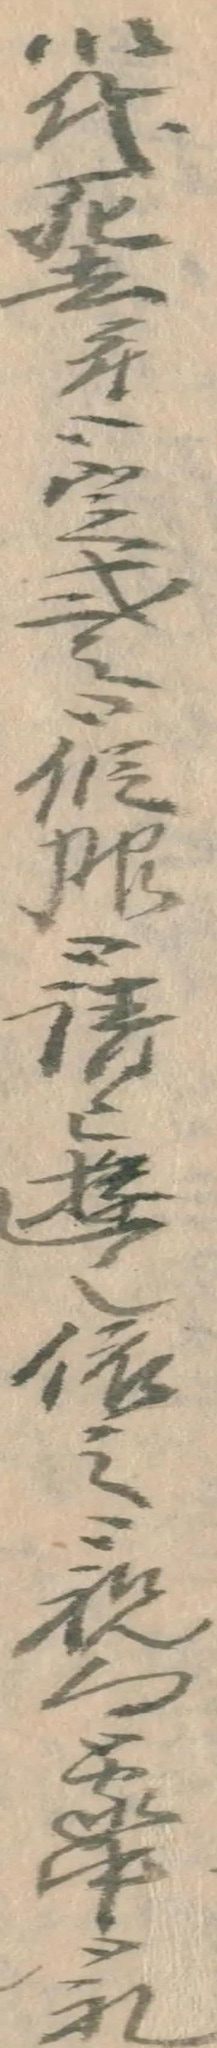小代死去ニ付御定式之御假服御請被遊也依之御祝向御家中御礼
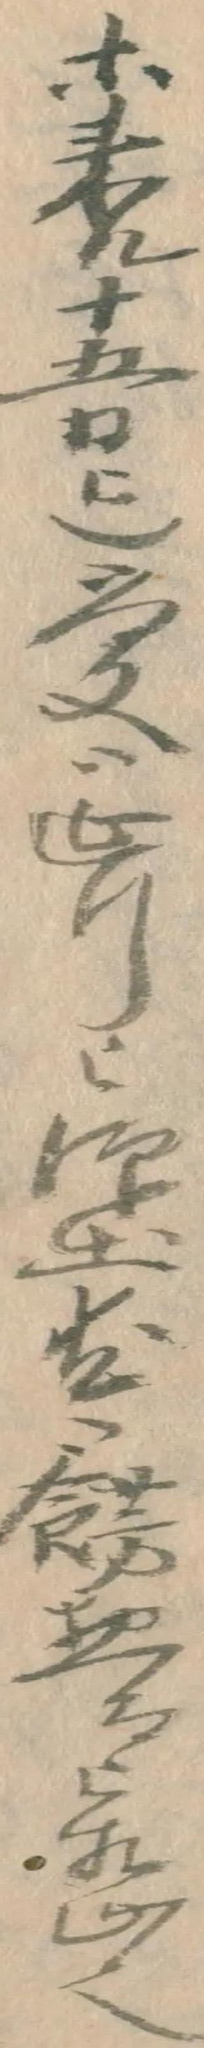等来ル十五日迄尚又御延引被仰出尤御餝惣而被相延也
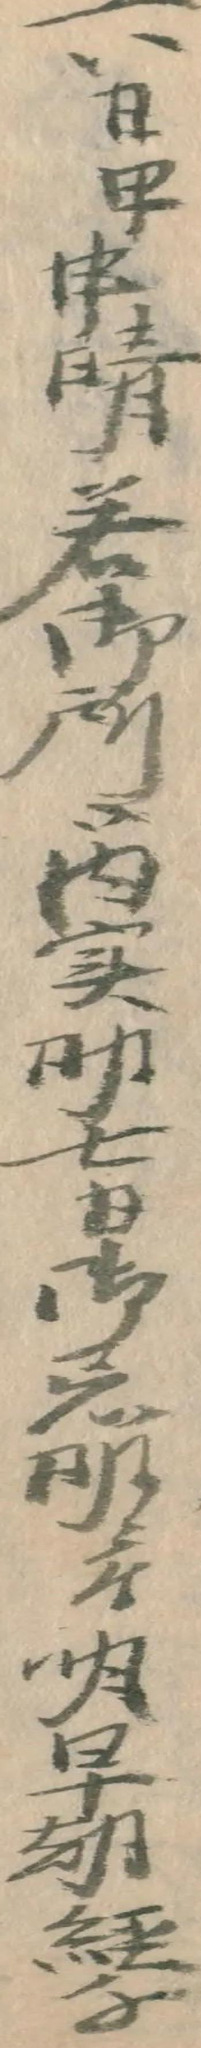六日甲申晴若御所御内実助七日御忌明ニ付明早朝経千
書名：賀茂社記録. 第67冊
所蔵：国立国会図書館 National Diet Library, JAPAN
